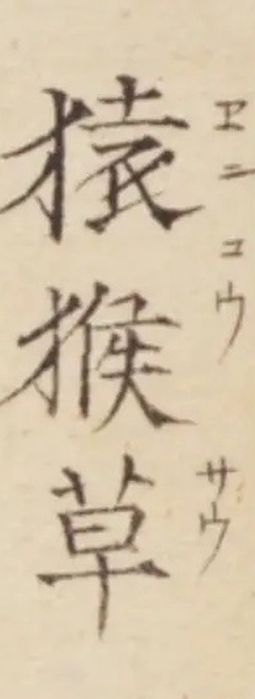猿猴草
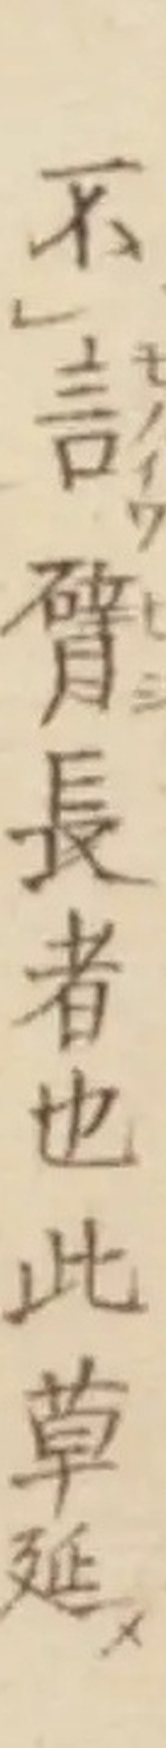不言臂長者也此の草延め
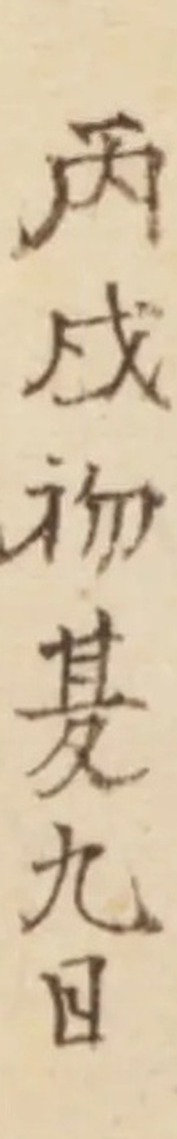丙戌初夏九日
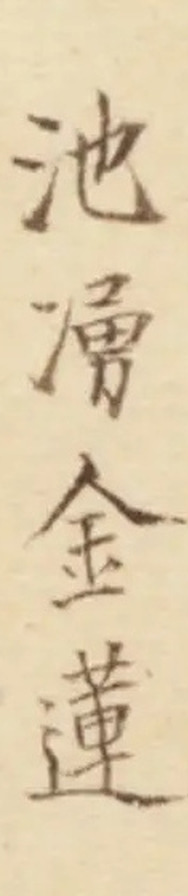池湧金蓮

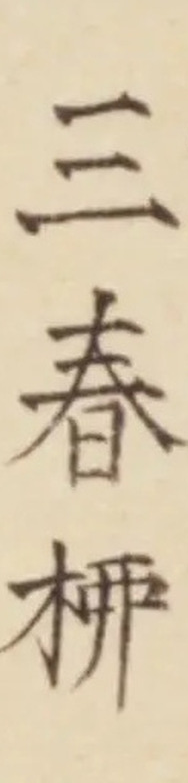三春桺
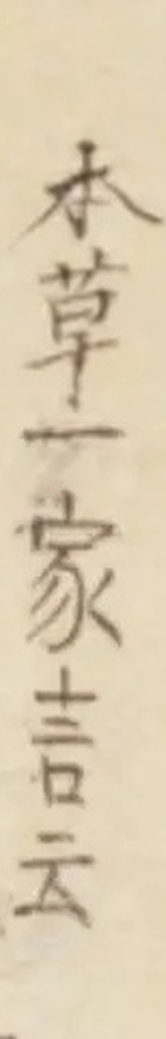本草一家言云
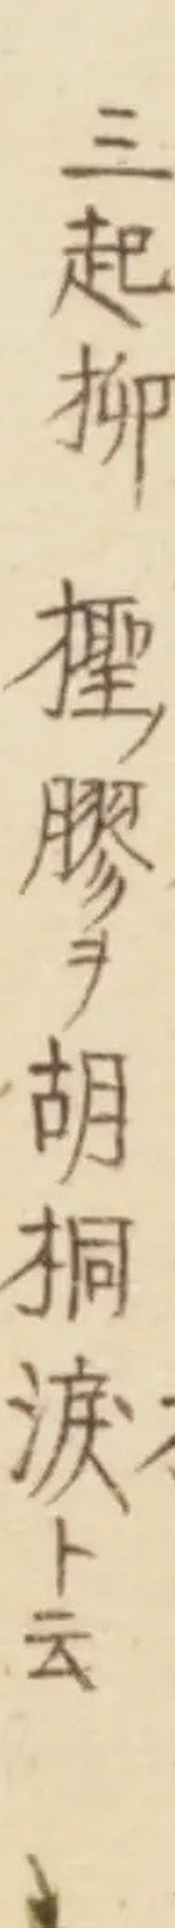三起柳檉の膠を胡桐涙と云
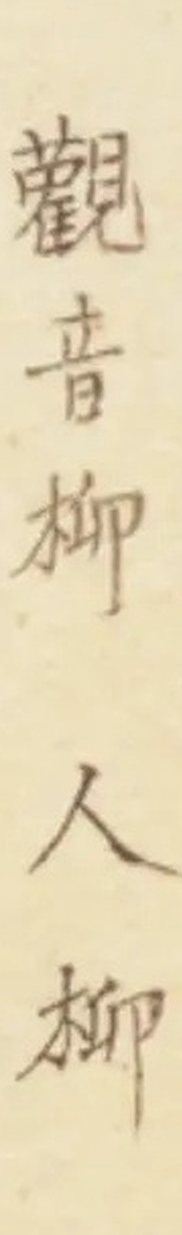觀音柳人柳
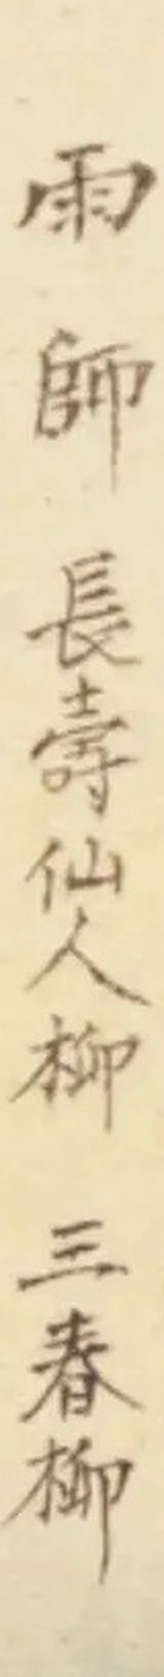雨師長壽仙人柳三春桺
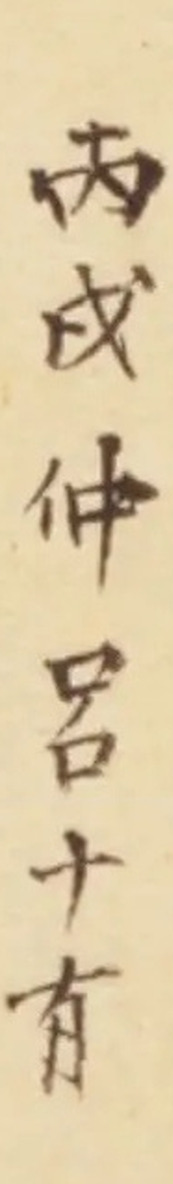丙戌仲呂十有日
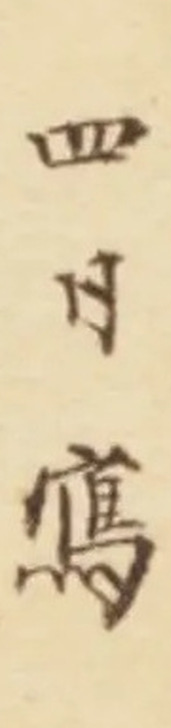四日寫

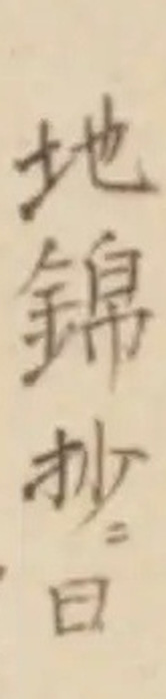地錦抄に曰
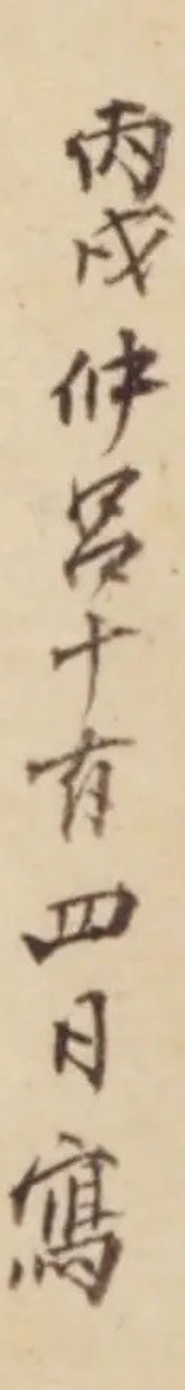丙戌仲呂十有四日寫
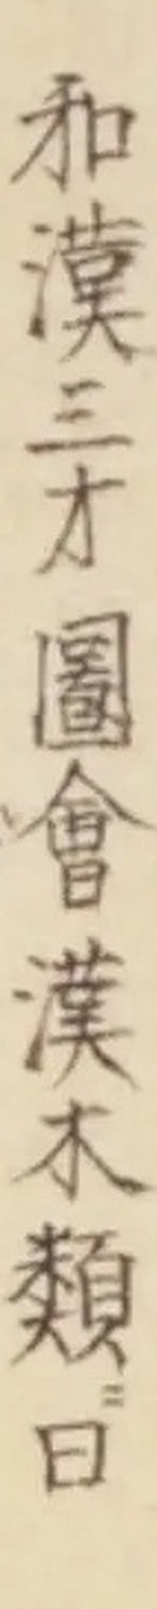和漢三才圖會漢木類に曰
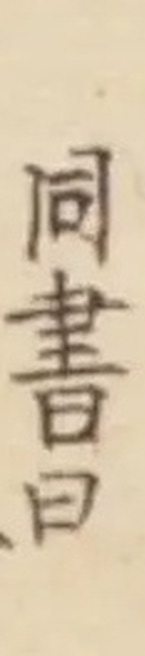同書曰
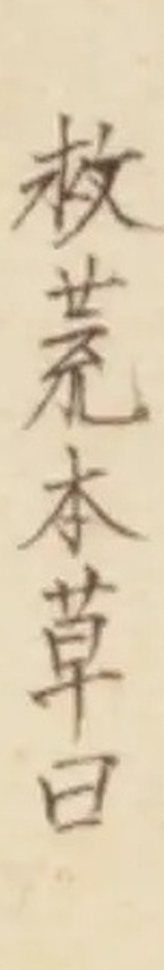救荒本草曰
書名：梅園草木花譜夏之部. 3
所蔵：国立国会図書館 National Diet Library, JAPAN
